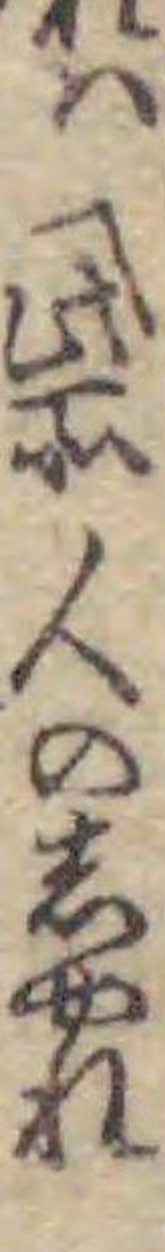〽此所人のしやれ
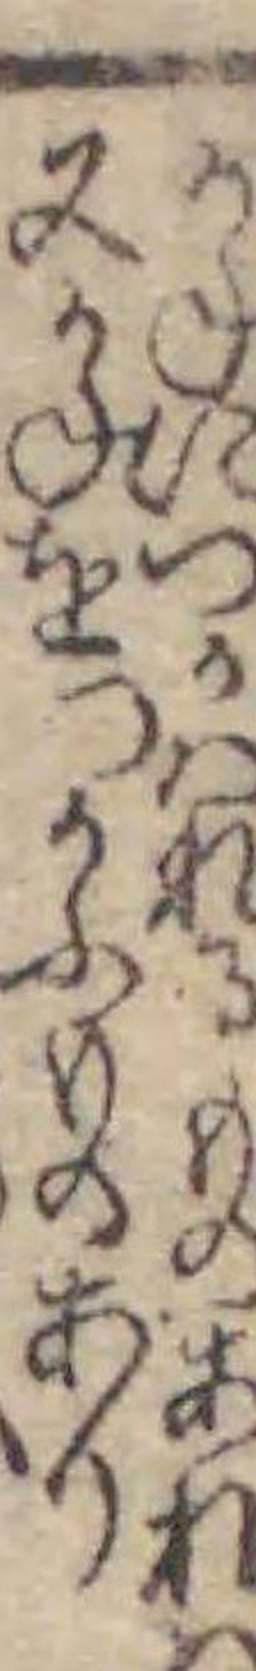又かねをつかふものあり
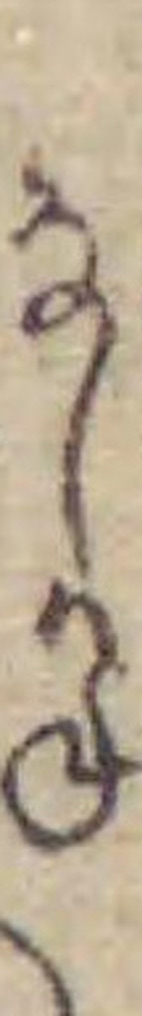なしかね
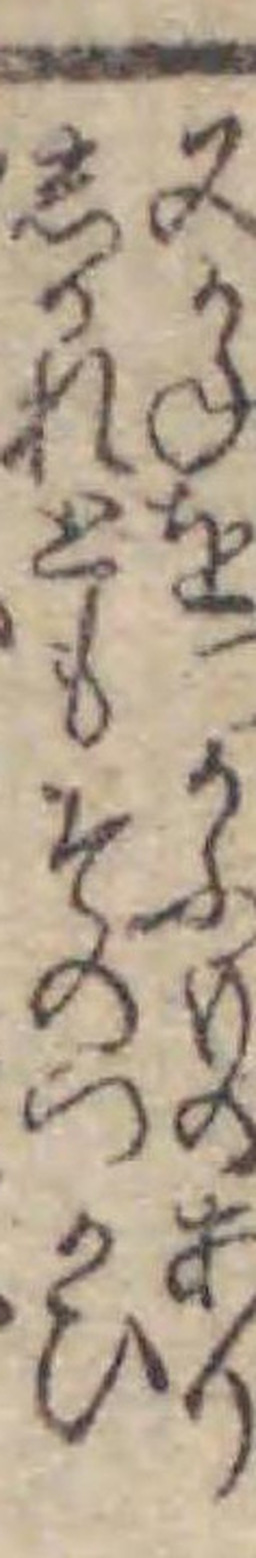しかれともそのつかひ
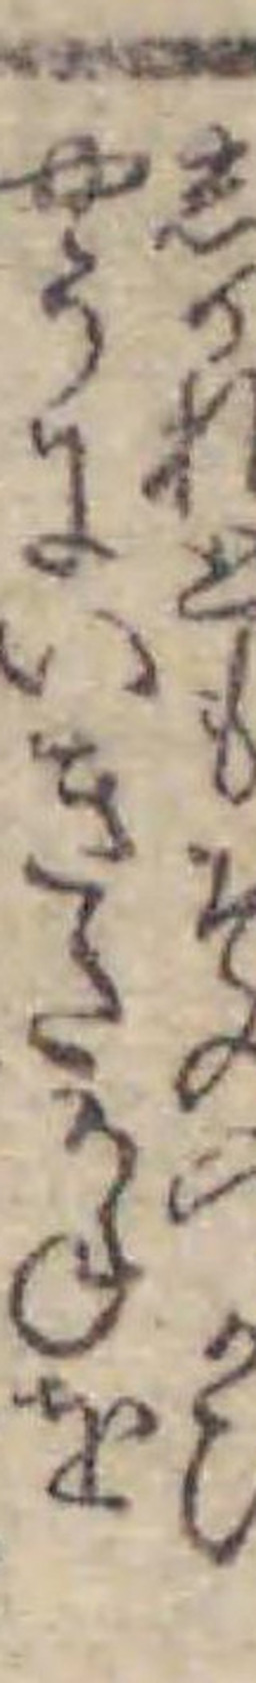やうにいきたかねを
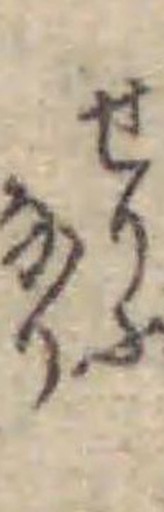せりふ
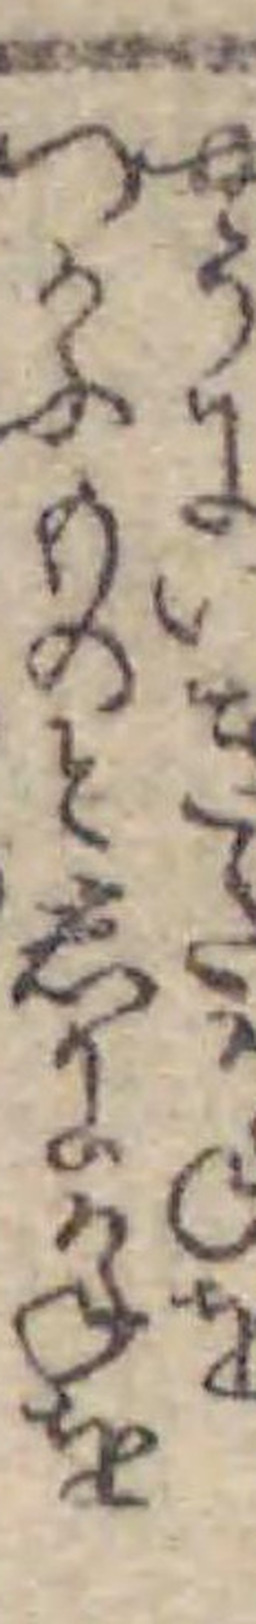つかふものとしにかねを
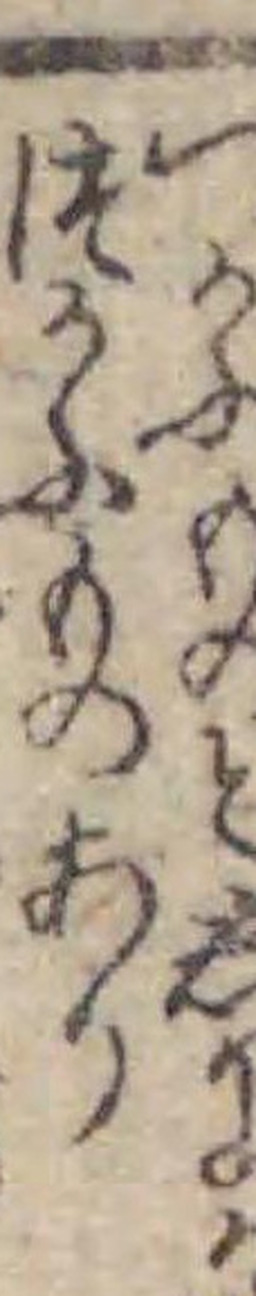つかふものあり
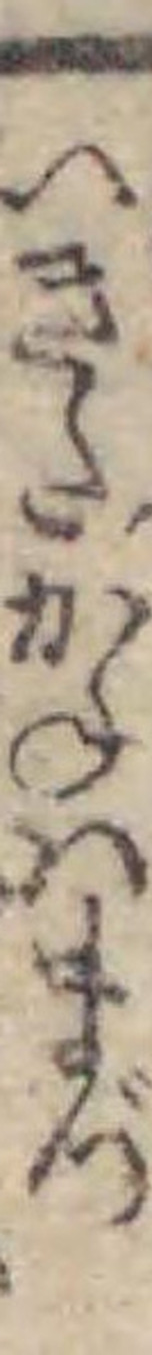いきたかねはまづ
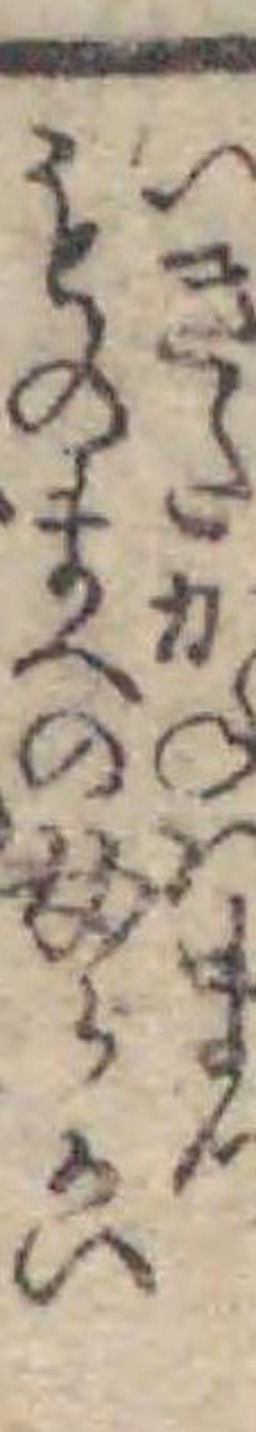ものまへの女郎かい
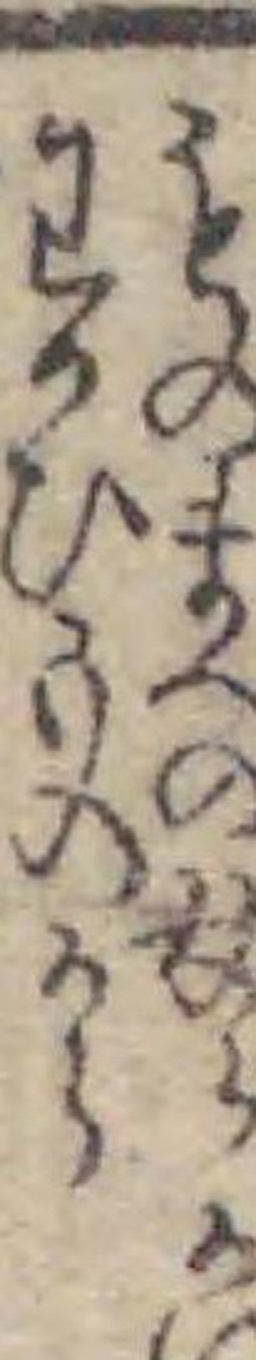わかひものから
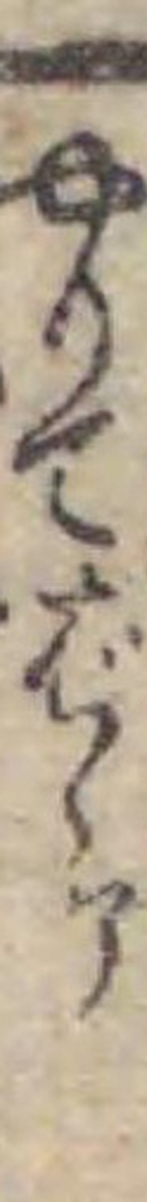やりてばゝァ
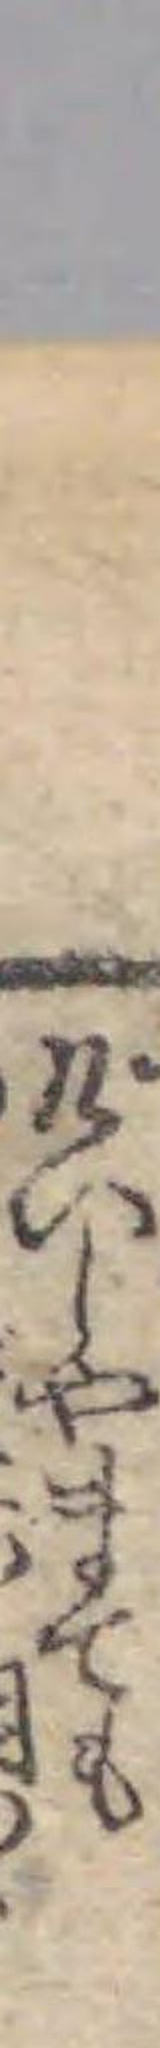けいしやまても
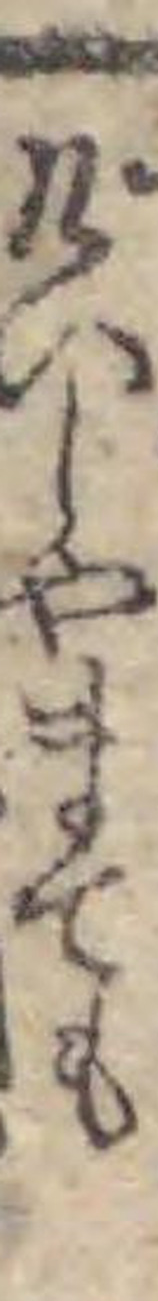けいしやまても
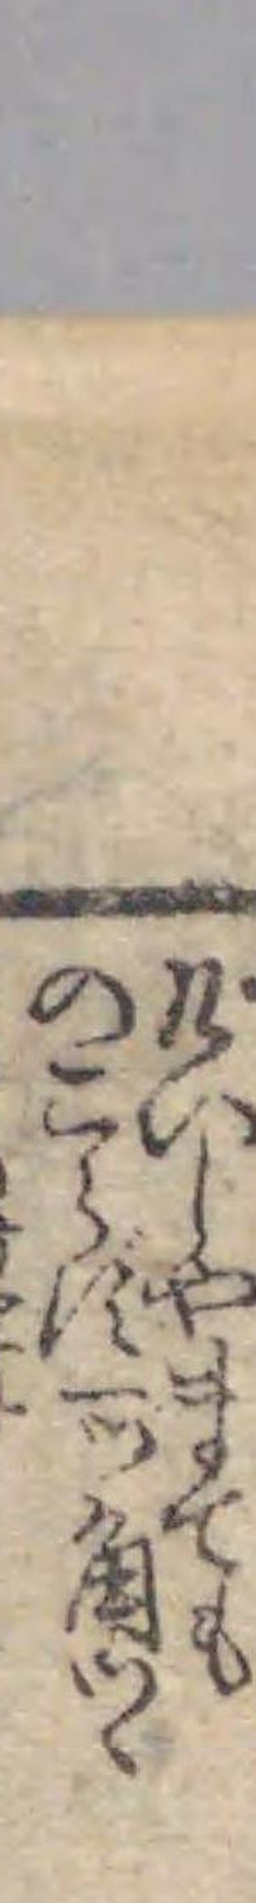のこらず一つ角つゝ
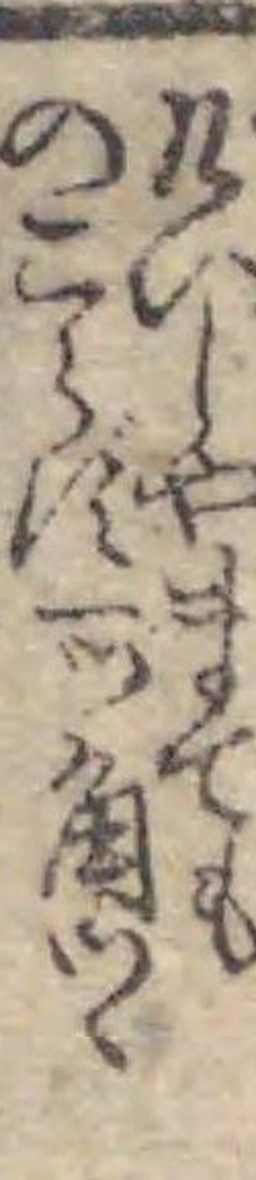のこらず一つ角つゝ
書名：新鋳小判 : 3巻
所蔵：国立国会図書館 National Diet Library, JAPAN
